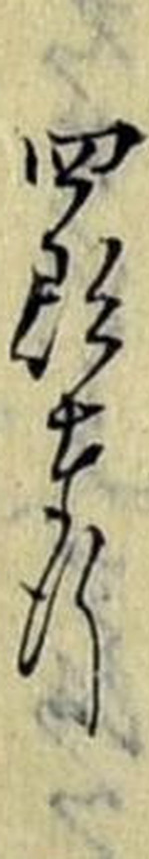四郡奉行
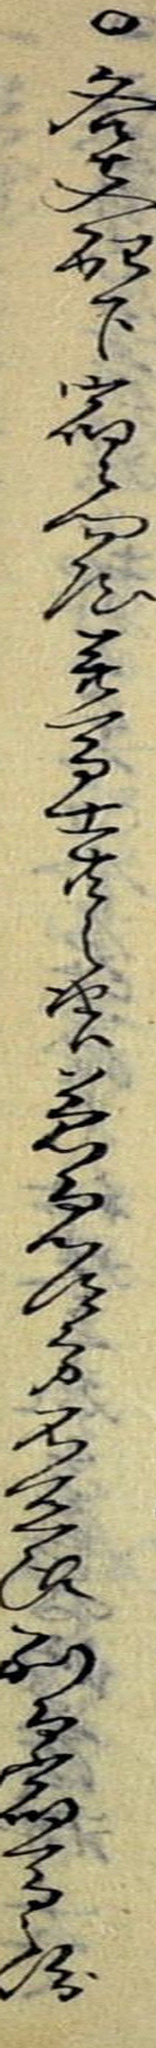○各支配下宿之問屋并馬士共之儀は兼而心得方不宜趣別而宿馬之儀
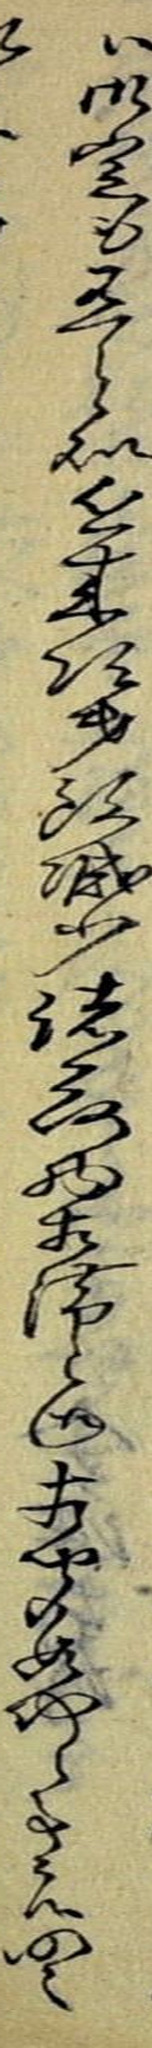は御定も有之候処近来致減少諸荷物相滞候趣相聞如何之事に候仍之
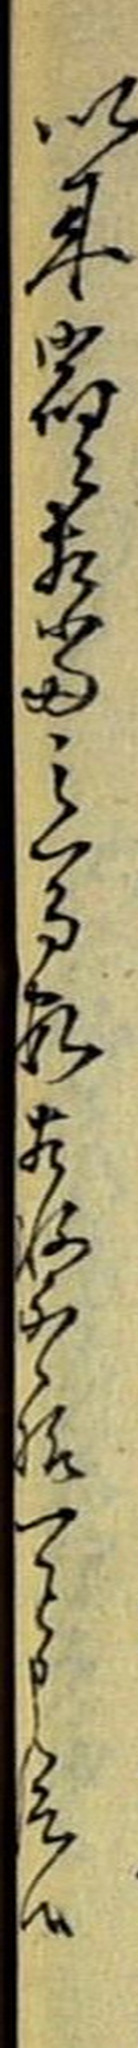以來宿々相当之馬数相繋候様可被申渡候
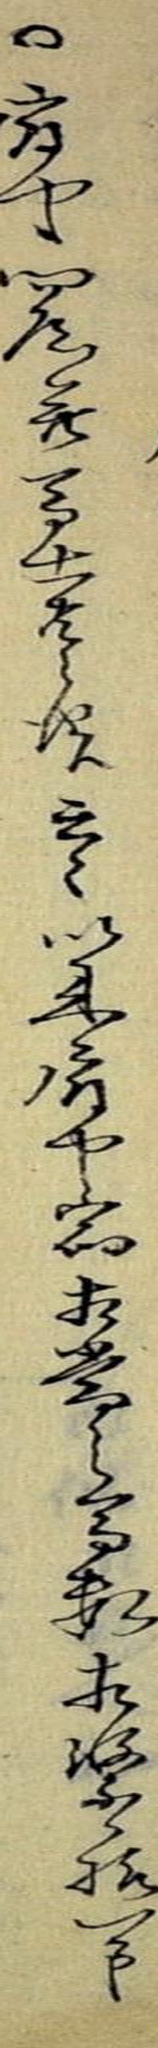○府中問屋共并馬士共之儀は云々以來府中宿相当之馬数相繋候様可被申
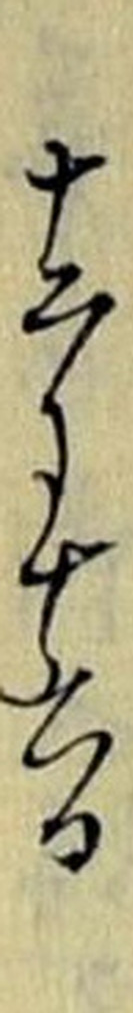十二月十六日

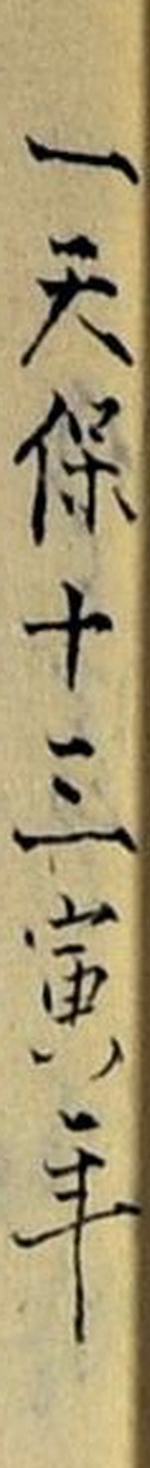一天保十三寅年
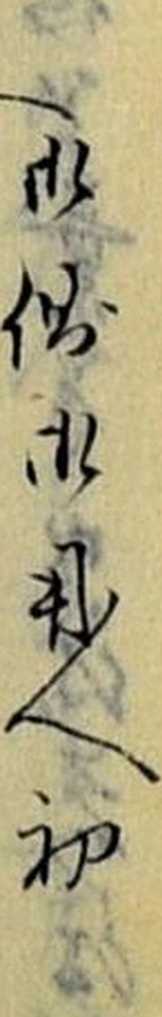御側御用人初
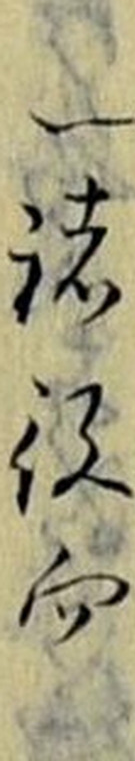諸役向
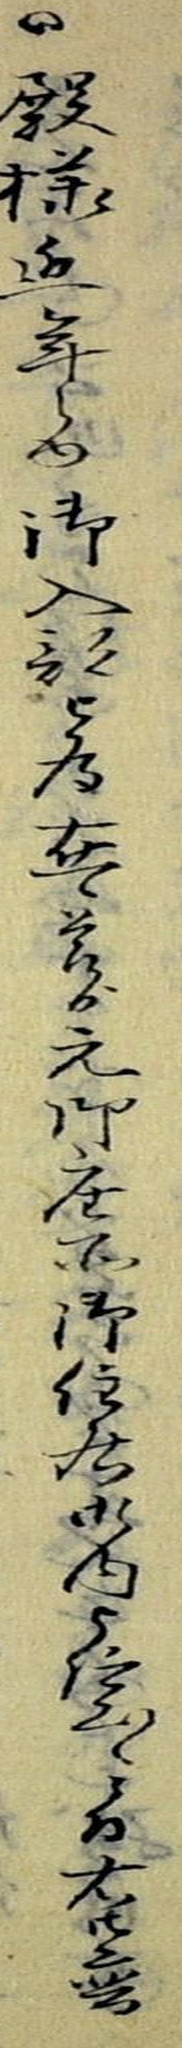○殿様近年之内御入部被為在候節ゟ元御座所御住居御内被仰出候に付右御普
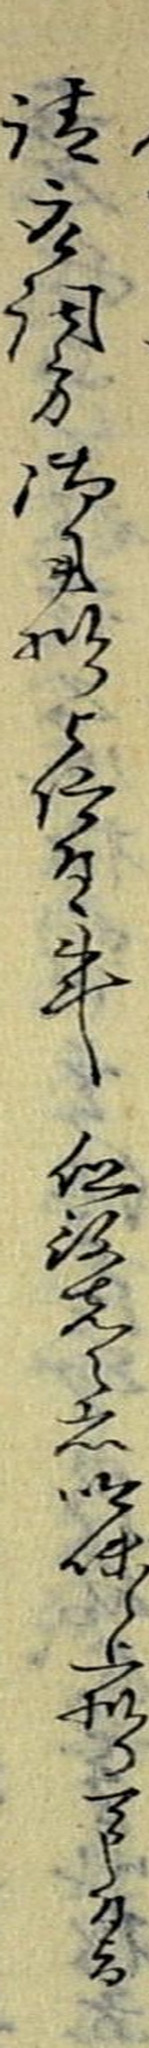請取調方御用掛り被仰付候事但役先之者吟味之上掛り可申付旨
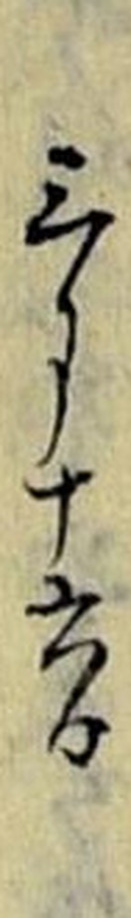三月十六日
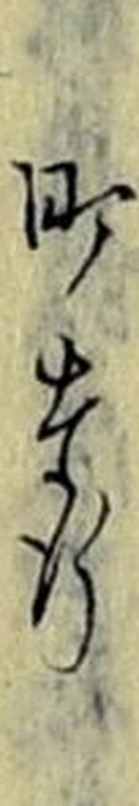町奉行
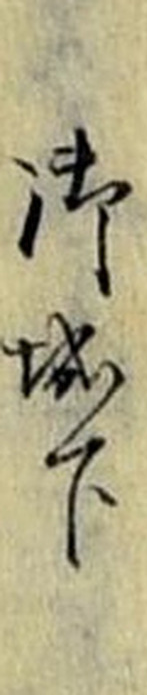御城下
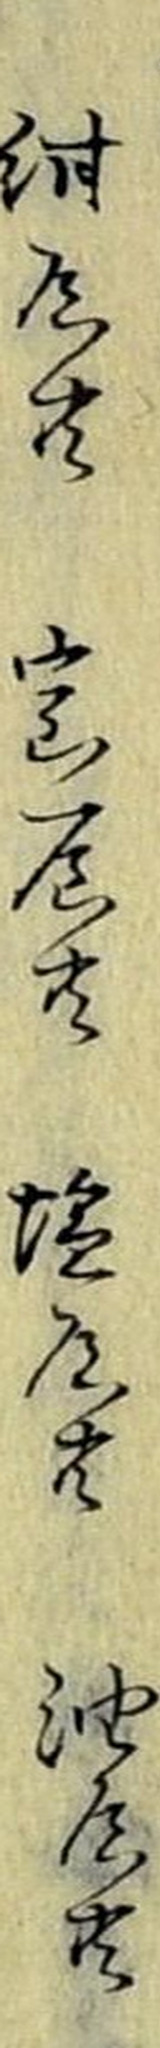紺屋共室屋共塩屋共油屋共
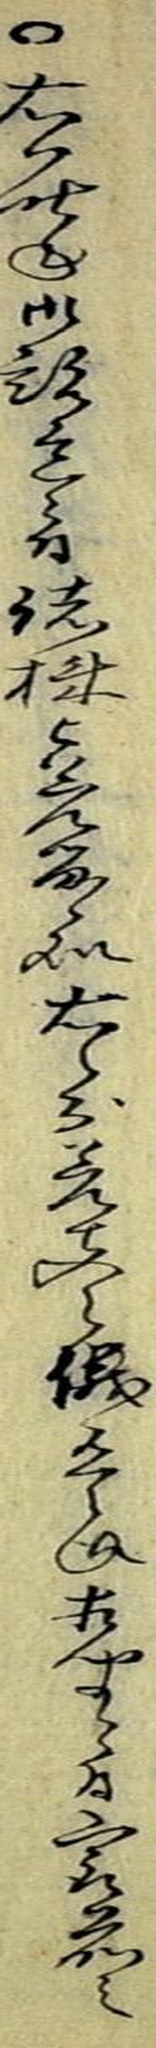○右は昨年御趣意に付諸株被差留候処右之分差支之儀有之趣相聞候に付最前之
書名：命令之部 六
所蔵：福井県文書館 Fukui Prefectural Archives
